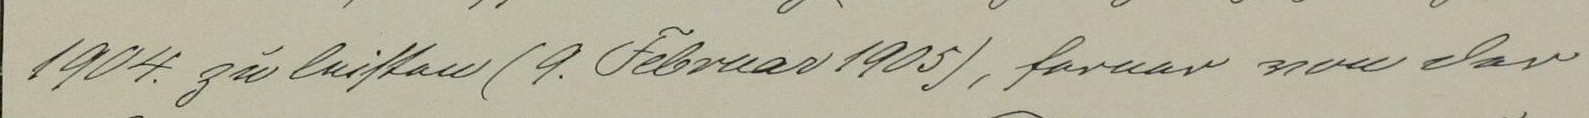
1904. zu leisten (9. Februar 1905), ferner von der
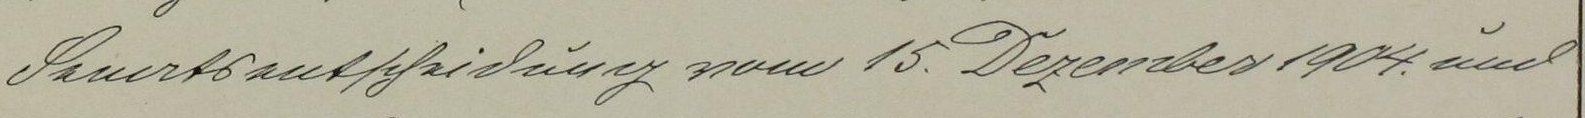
Senatsentscheidung vom 15. Dezember 1904. und
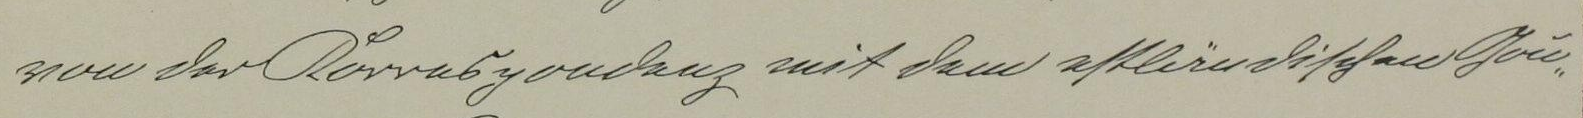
von der Korrespondenz mit dem estländischen Gou-
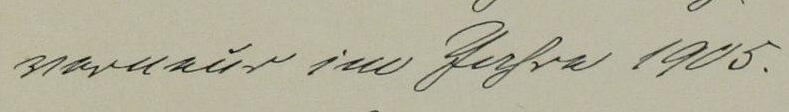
verneur im Jahre 1905.
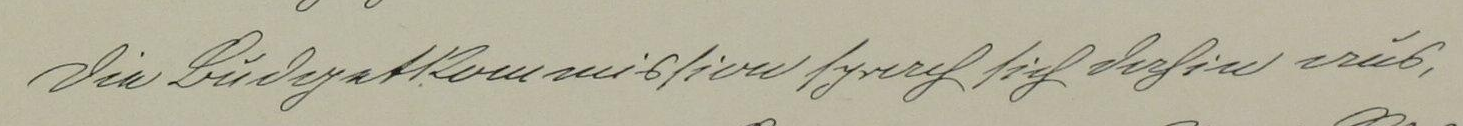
Die Budgetkommission sprach sich dahin aus,
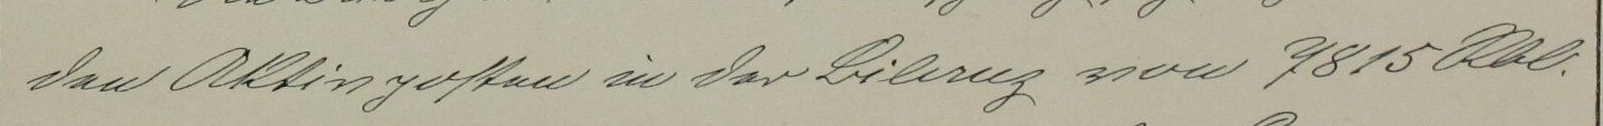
den Aktivposten in der Bilanz von 7815 Rbl.
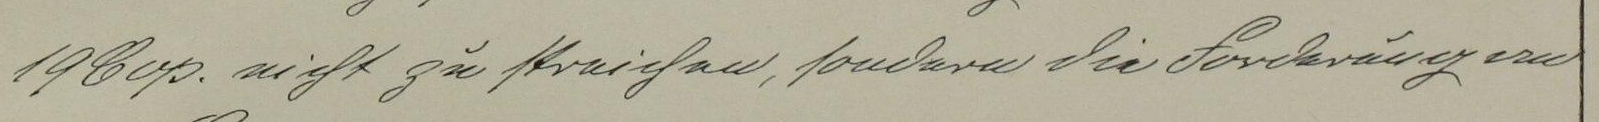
19 Cop. nicht zu streichen, sondern die Forderung an
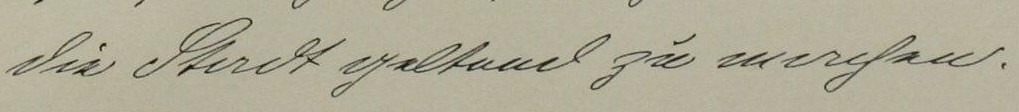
die Stadt geltend zu machen.
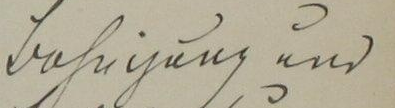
Beheizung und
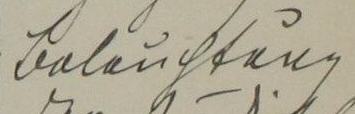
Beleuchtung
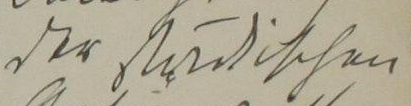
der städtischen
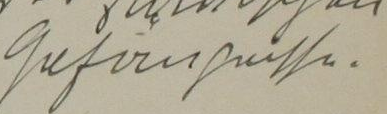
Gefängnisse.
